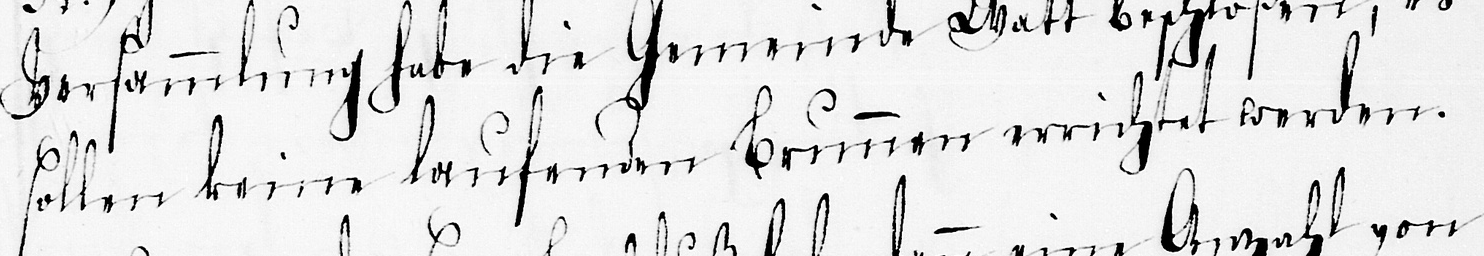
sollen keine laufenden Brunnen errichtet werden.
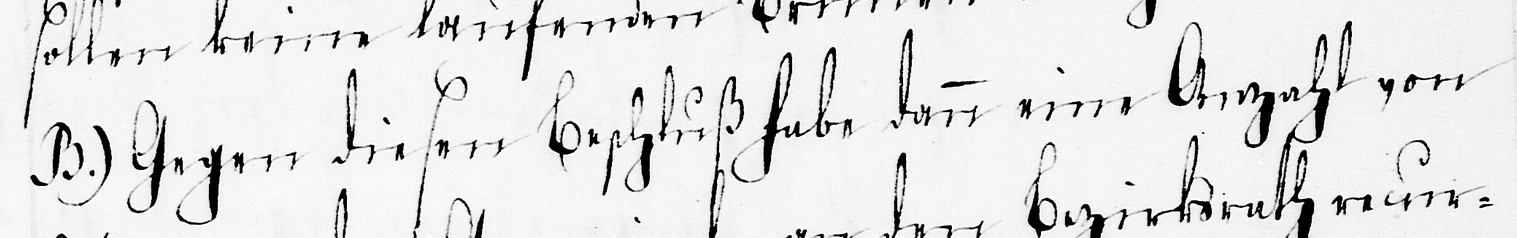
B.) Gegen diesen Beschluß habe dann eine Anzahl von
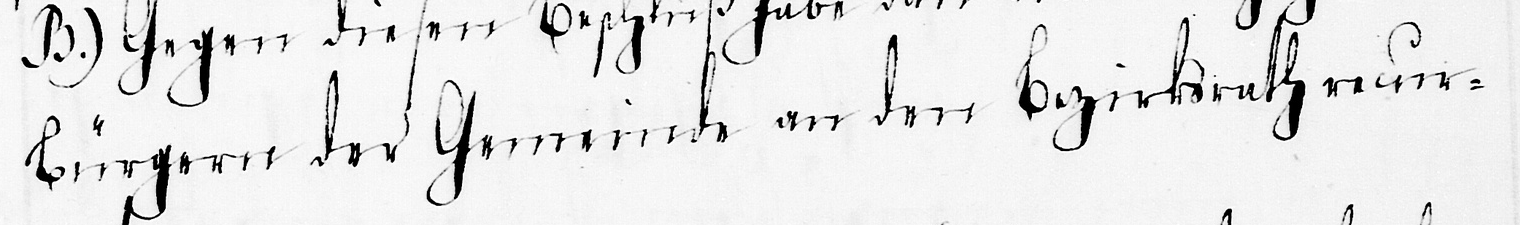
Bürgern der Gemeinde an den Bezirksrath recur¬
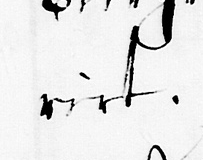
Dies¬
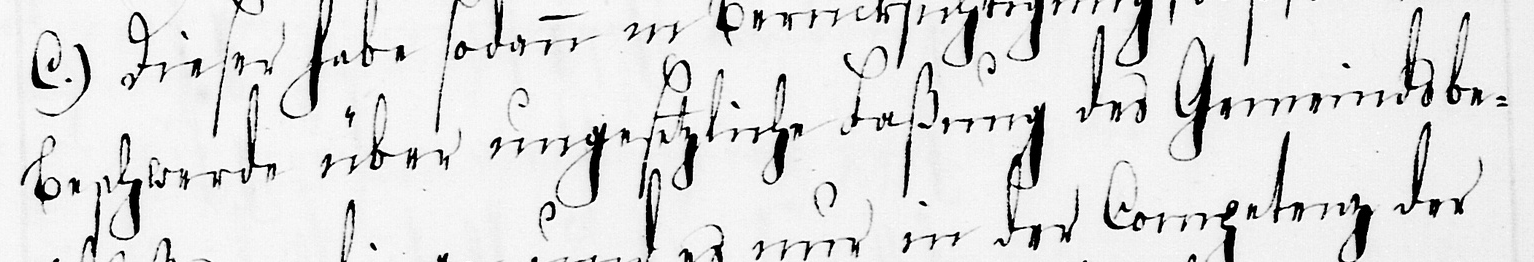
Beschwerde über ungesetzliche Faßung des Gemeindsbe¬
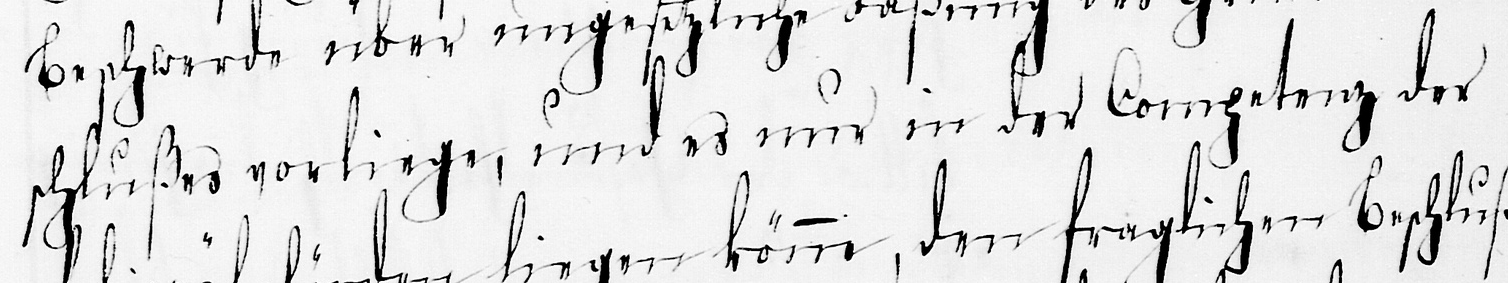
schlußes vorliege, und es nur in der Competenz der
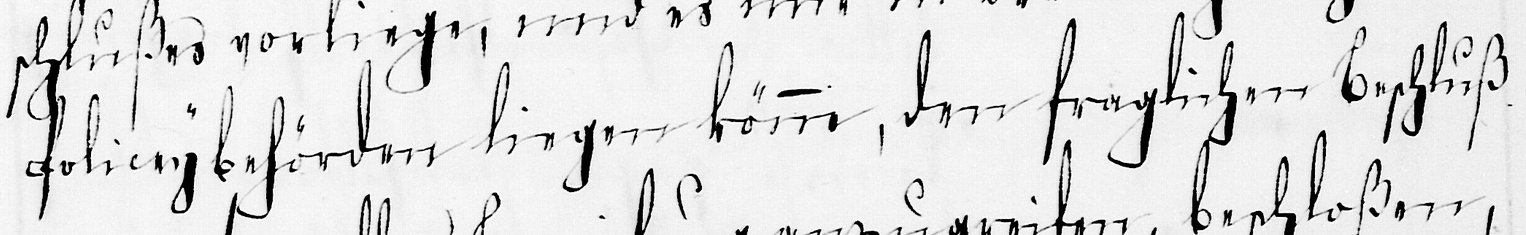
Policeybehörden liegen könne, den fraglichen Beschluß
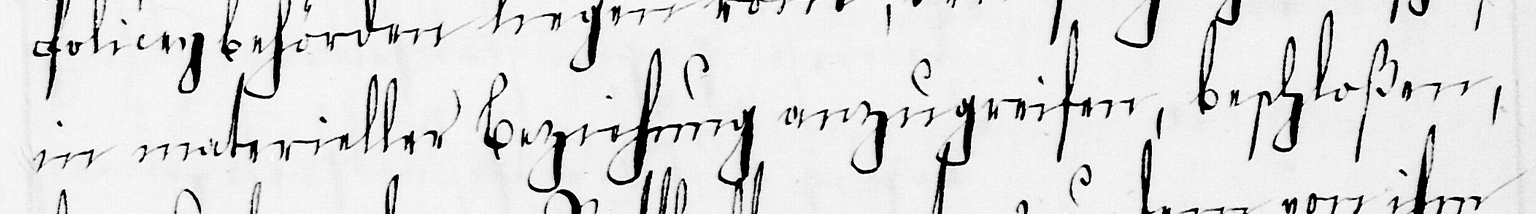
in materieller Beziehung anzugreifen, beschloßen,
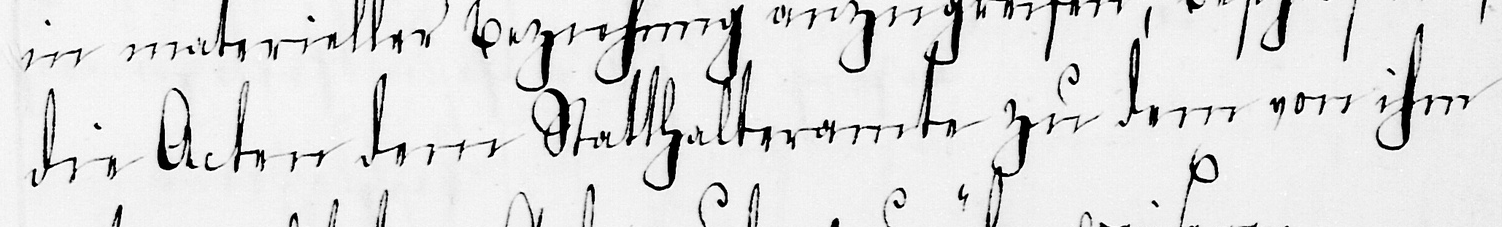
die Acten dem Statthalteramte zu dem von ihm
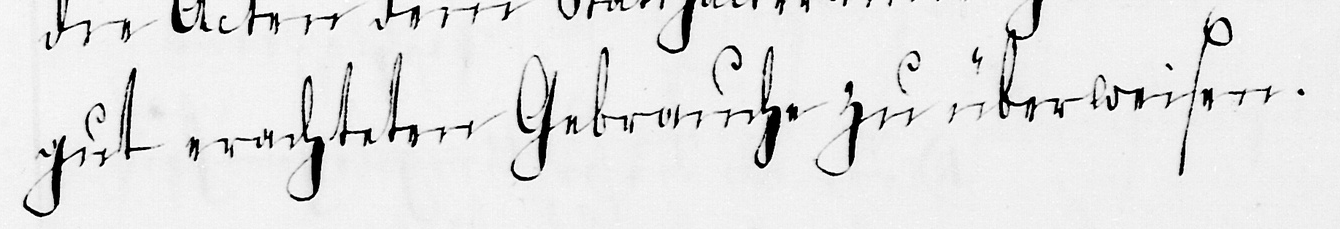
gut erachteten Gebrauche zu überweisen.
